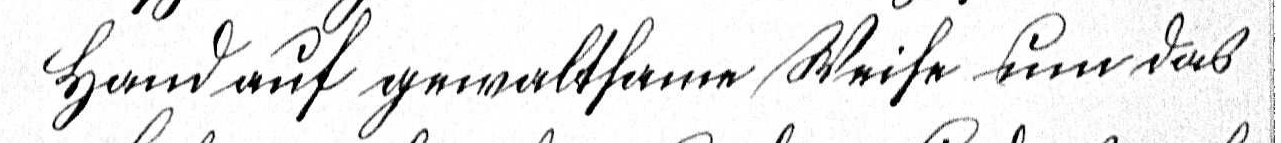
Hand auf gewaltsame Weise um das
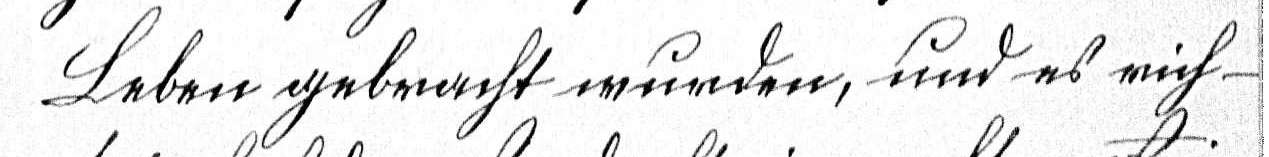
Leben gebracht wurden, und es rich¬
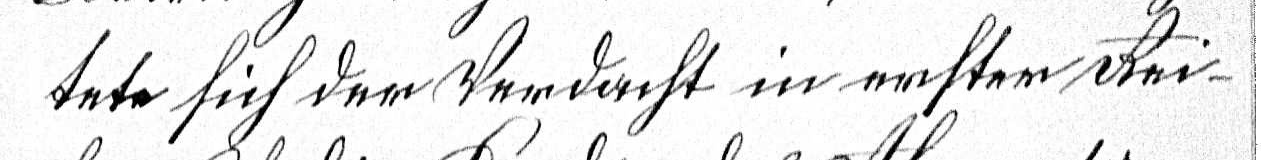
tete sich der Verdacht in erster Rei¬
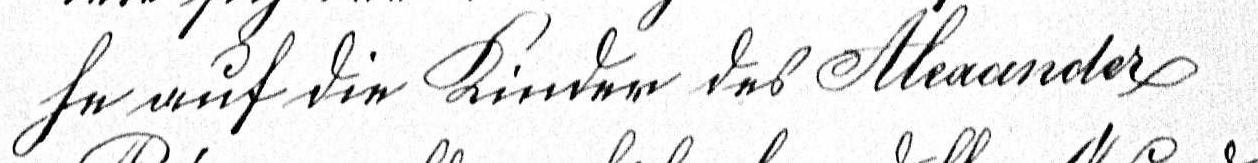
he auf die Kinder des Alexander
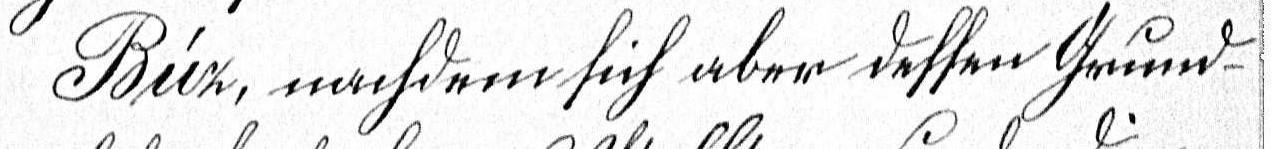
Búz, nachdem sich aber dessen Grund¬
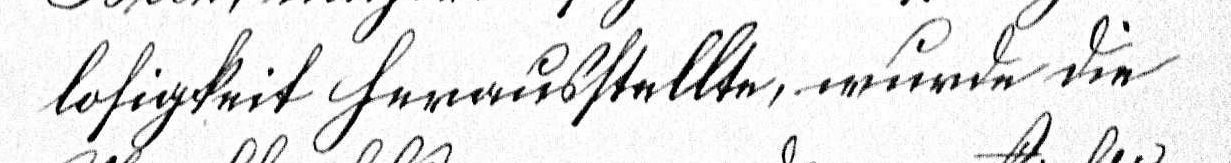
losigkeit herausstellte, wurde die
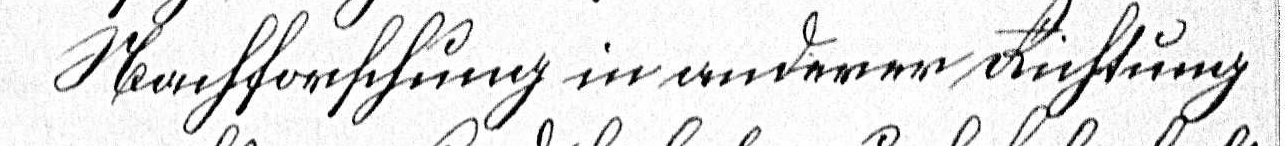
Nachforschung in anderer Richtung
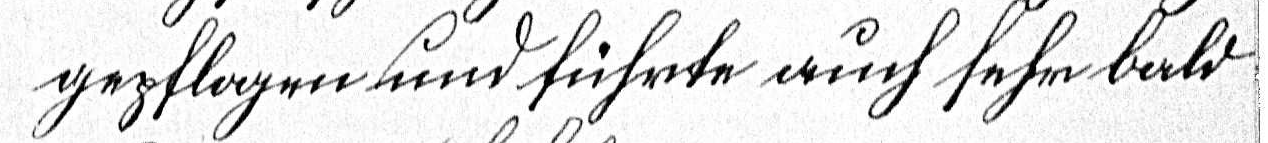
gepflogen und führte auch sehr bald
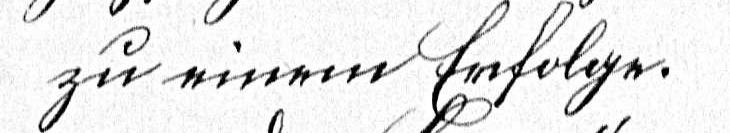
zu einem Erfolge.
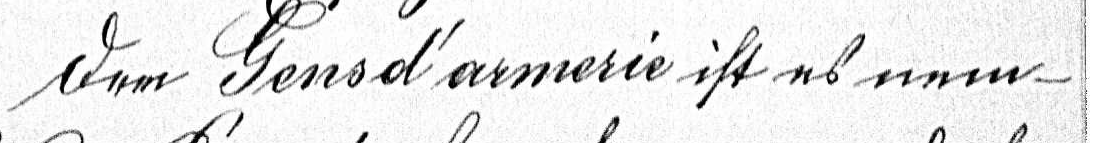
Der Gens d’armerie ist es nem¬
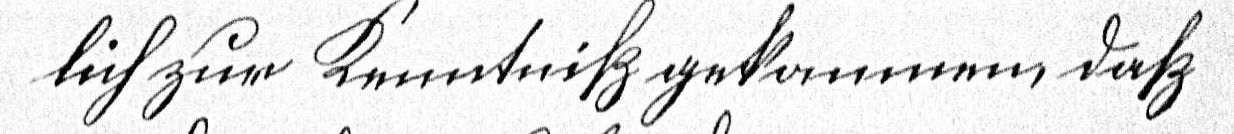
lich zur Kenntniß gekommen, daß
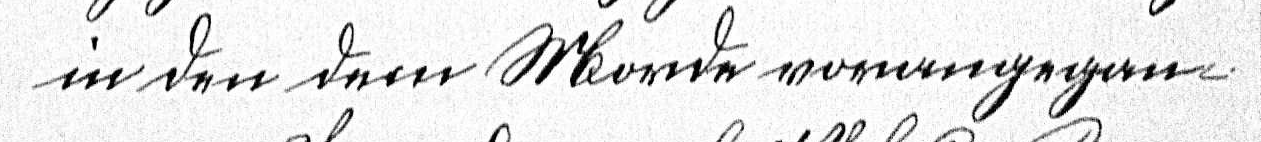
in den dem Morde vorangegan¬
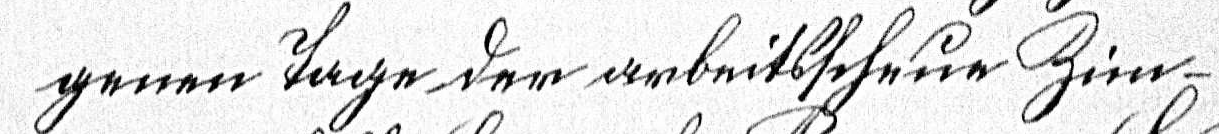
genen Tage der arbeitsscheue Zim¬
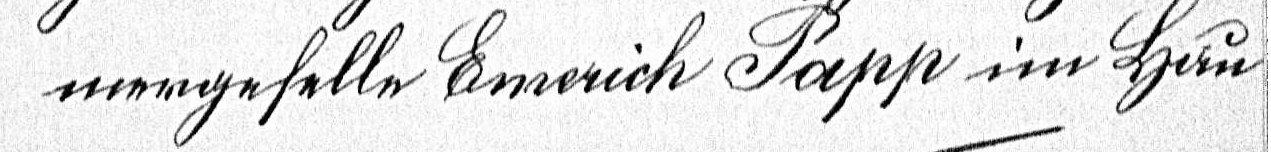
mergeselle Emerich Papp im Hau¬
